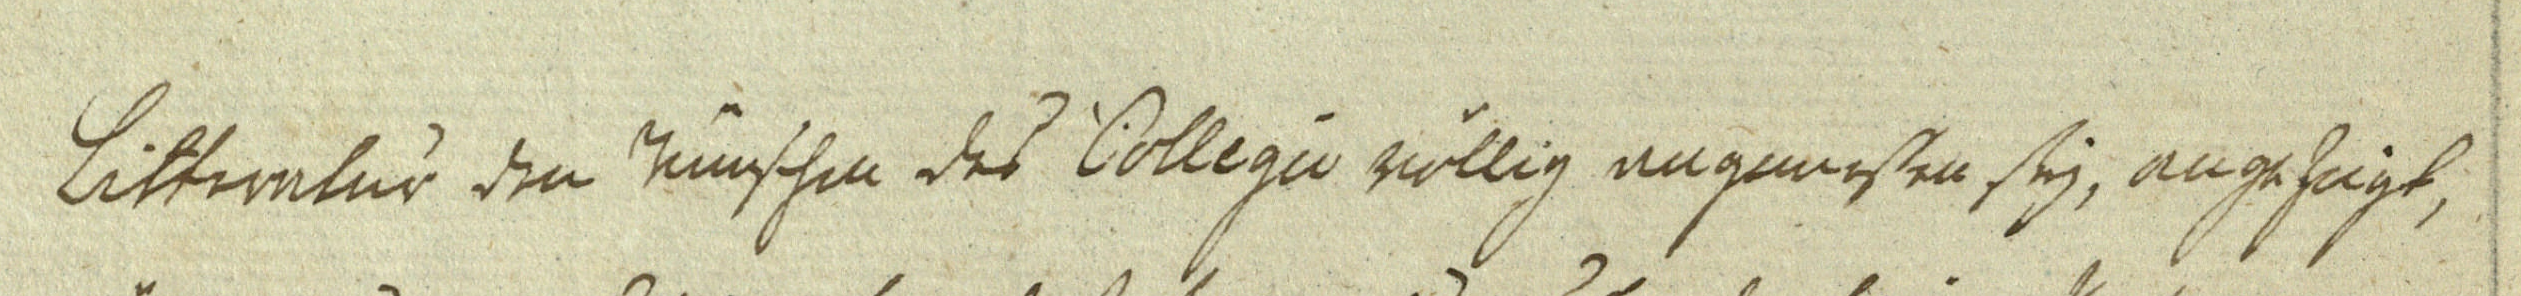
Litteratur den Wünschen des Collegii völlig angemessen seÿ, angezeigt,
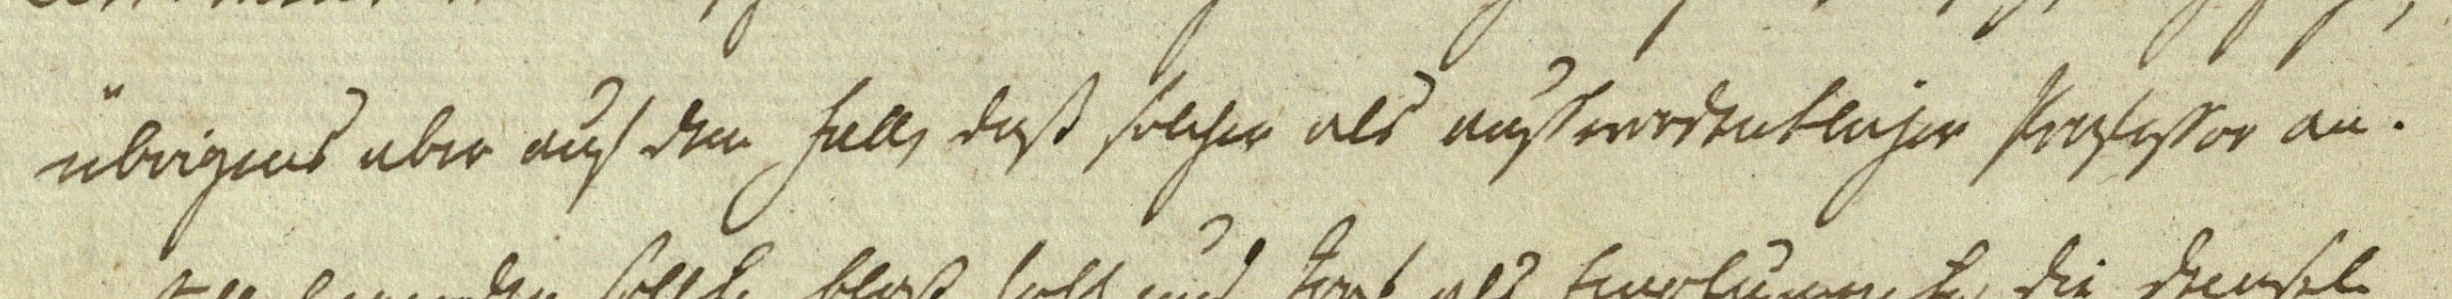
übrigens aber auf dem Fall, daß solcher als außerordentlicher Professor an¬
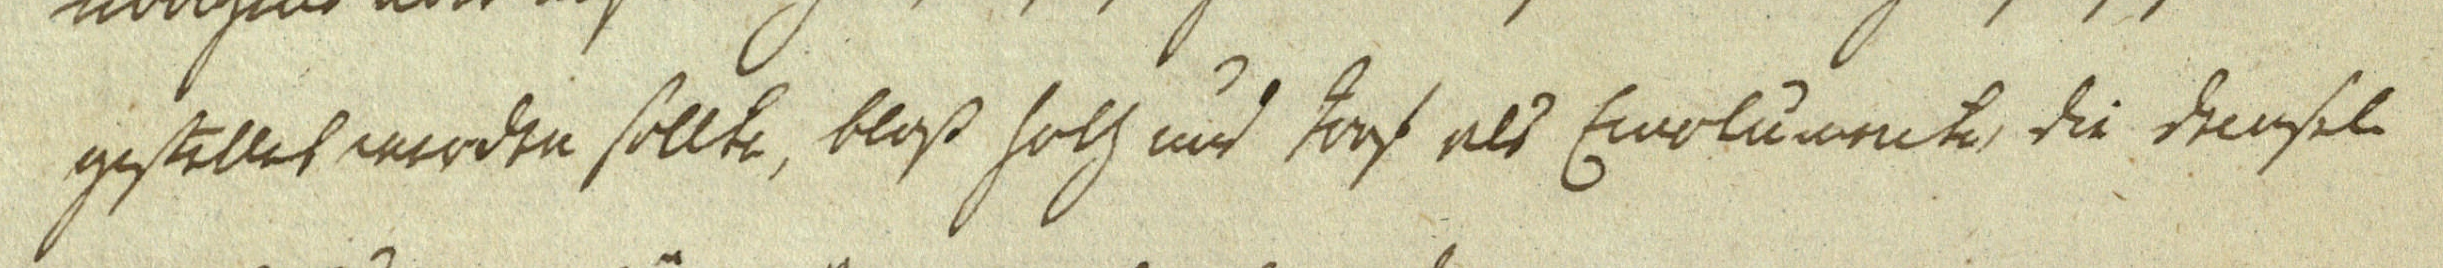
gestellet werden sollte, bloß Holz und Torf als Emolumente, die derselbe
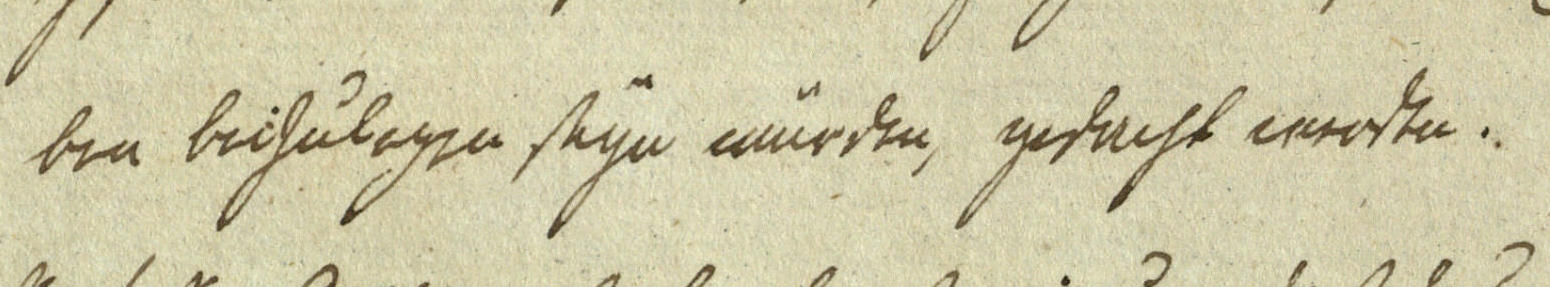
ben beizulegen seÿn würden, gedacht werden.
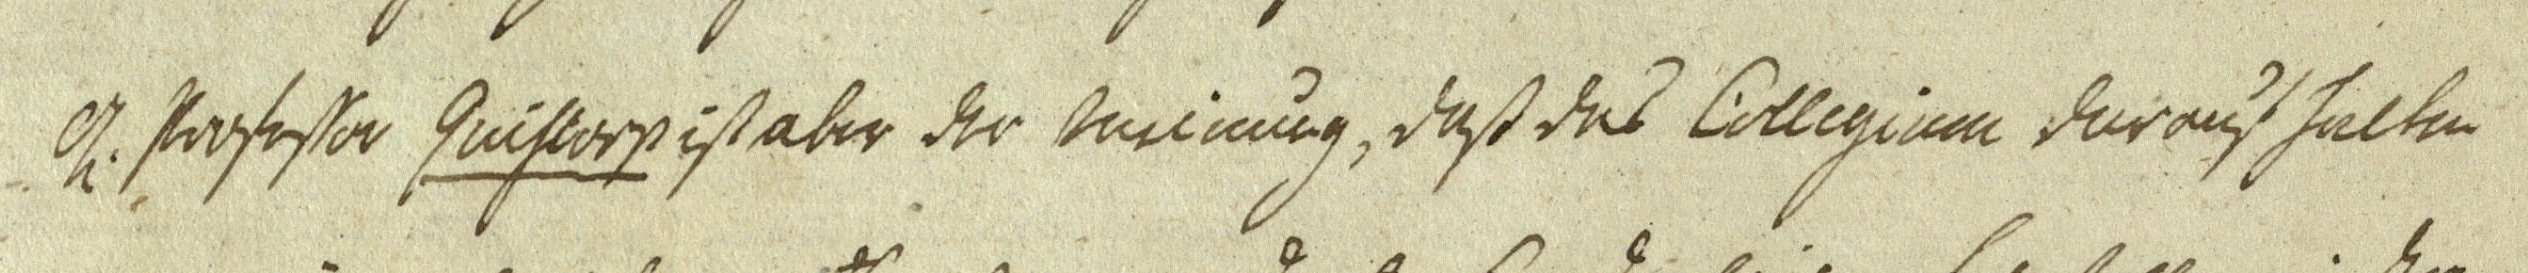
dh. Professor Quistorp ist aber der Meinung, daß das Collegium darauf halten
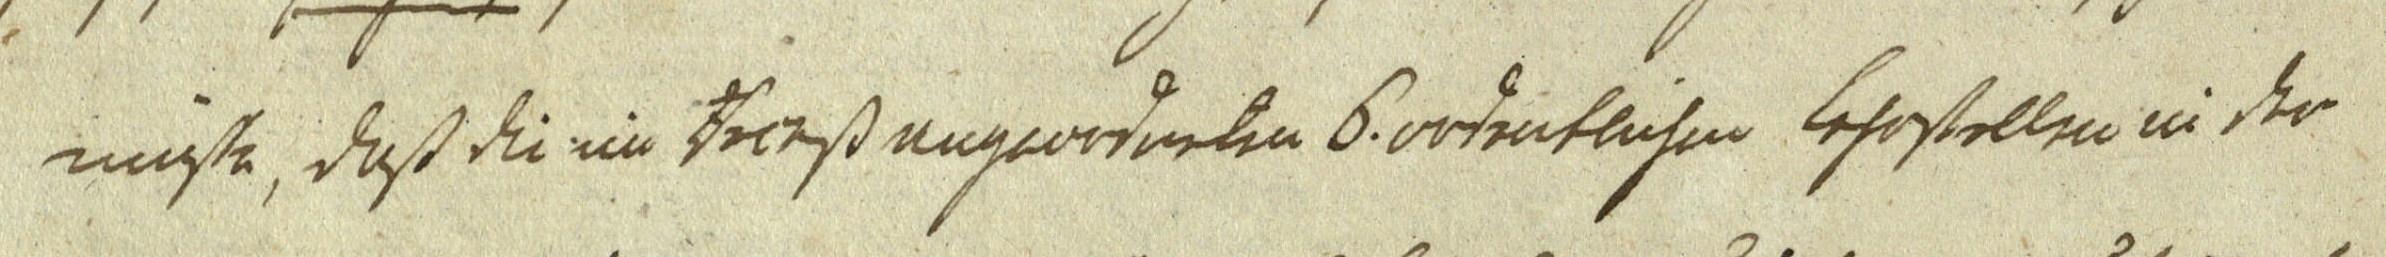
müsse, daß die im Receß angeordneten 6. ordentlichen Lehrstellen in der
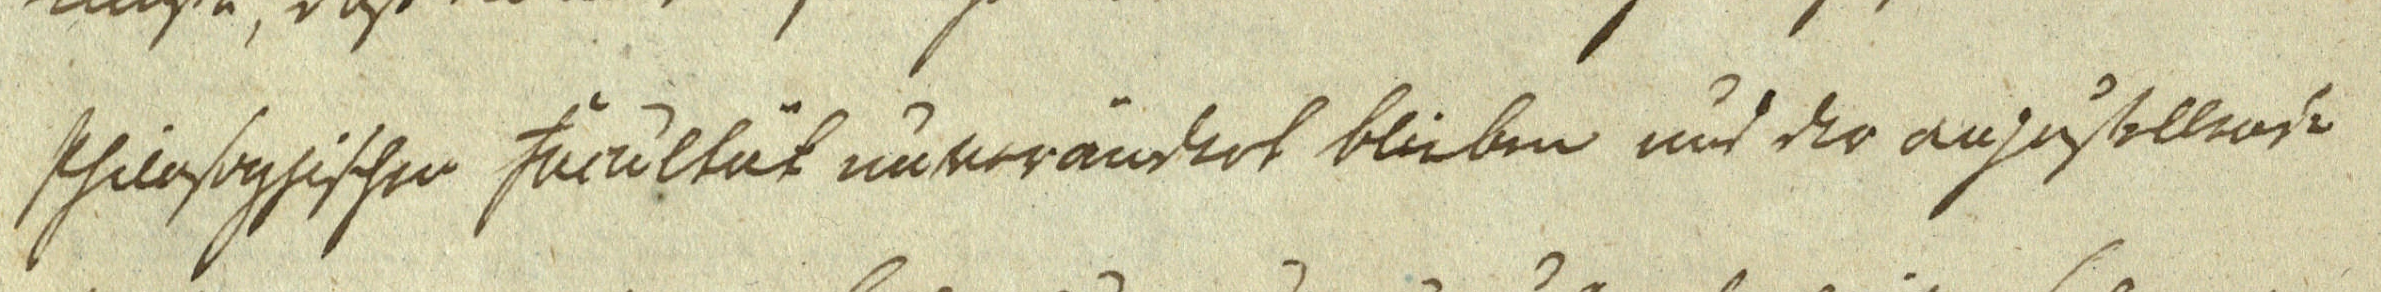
Philosophischen Facultät unverändert blieben und der anzustellende
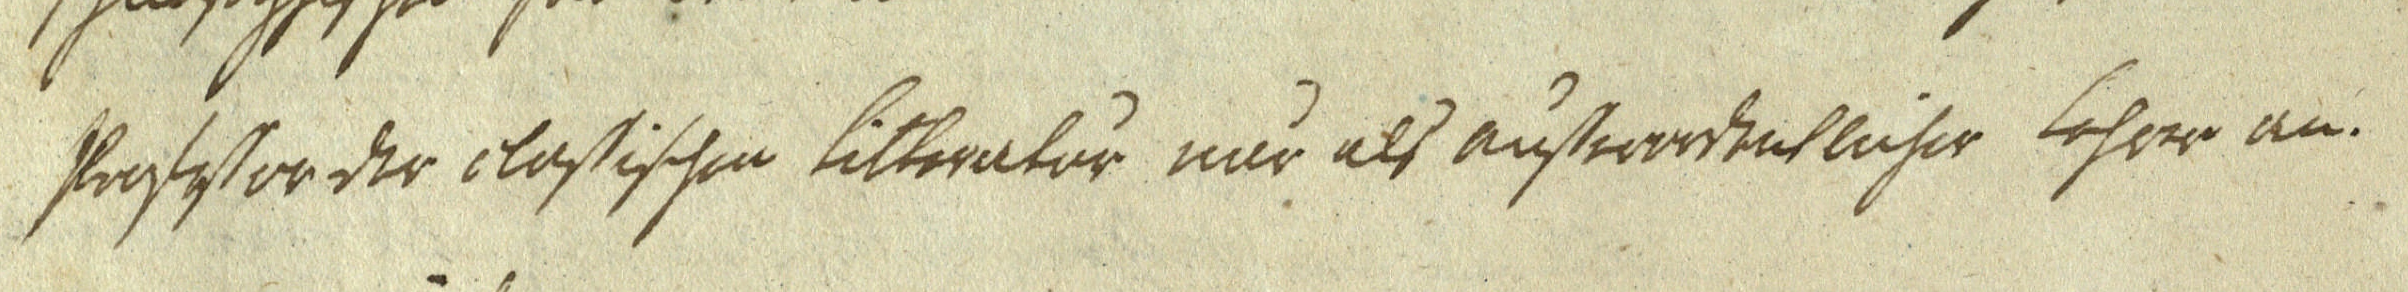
Professor der classischen Litteratur nur als ausserordentlicher Lehrer an¬
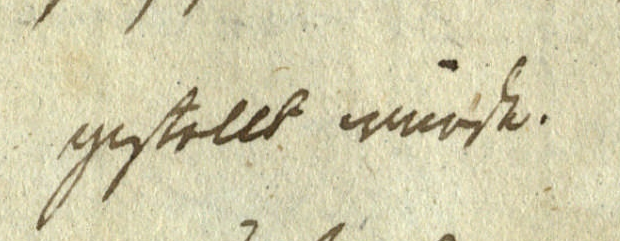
gestellt würde.
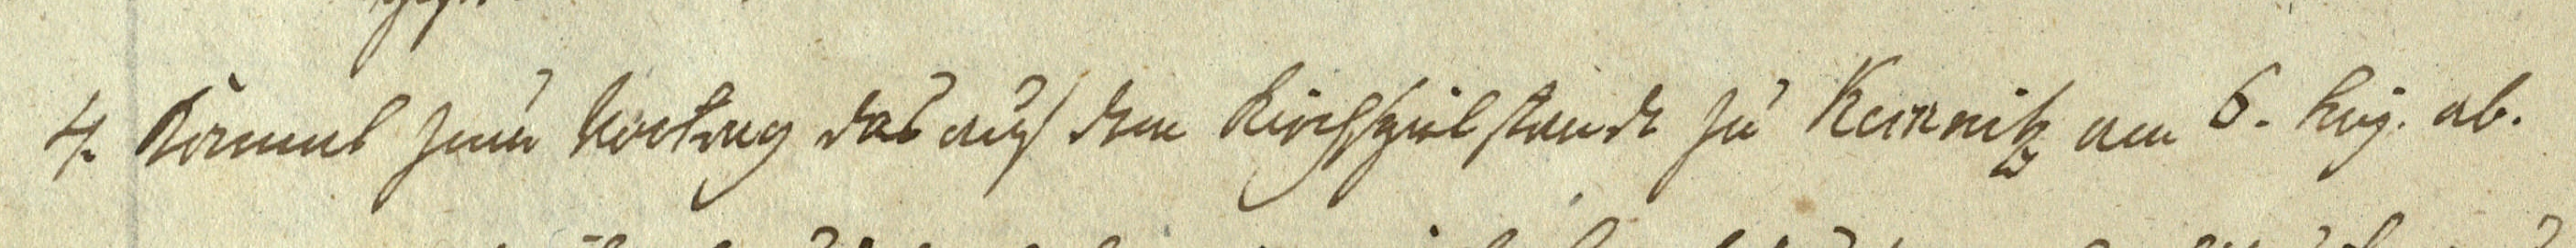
4. Kommt zum Vortrag das auf dem Kirchspielstande zu Kemnitz am 6. huj. ab¬
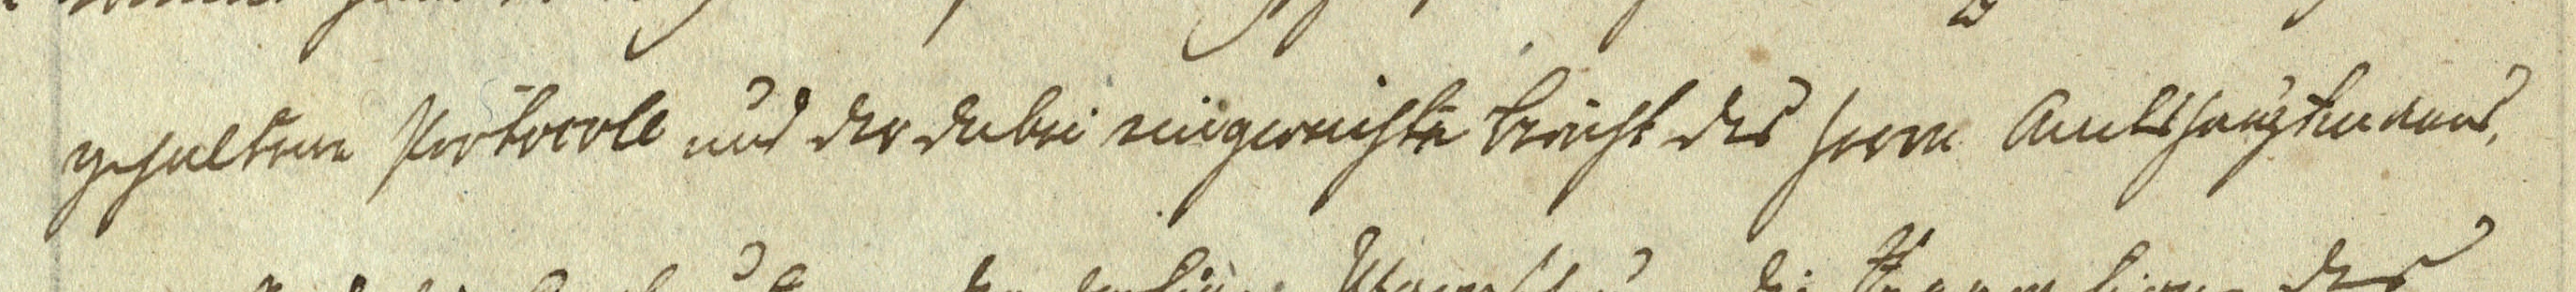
gehaltene Protocoll und der dabei eingereichte Bericht des Herrn Amtshauptmanns,
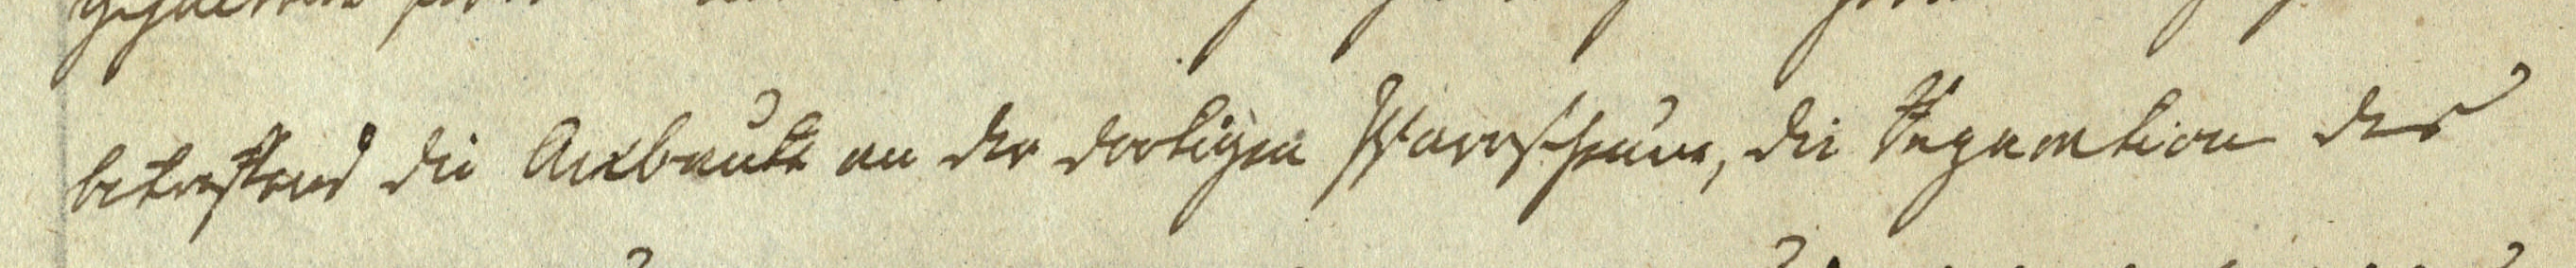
betreffend die Anbaute an der dortigen Pfarrscheune, die Reparation des
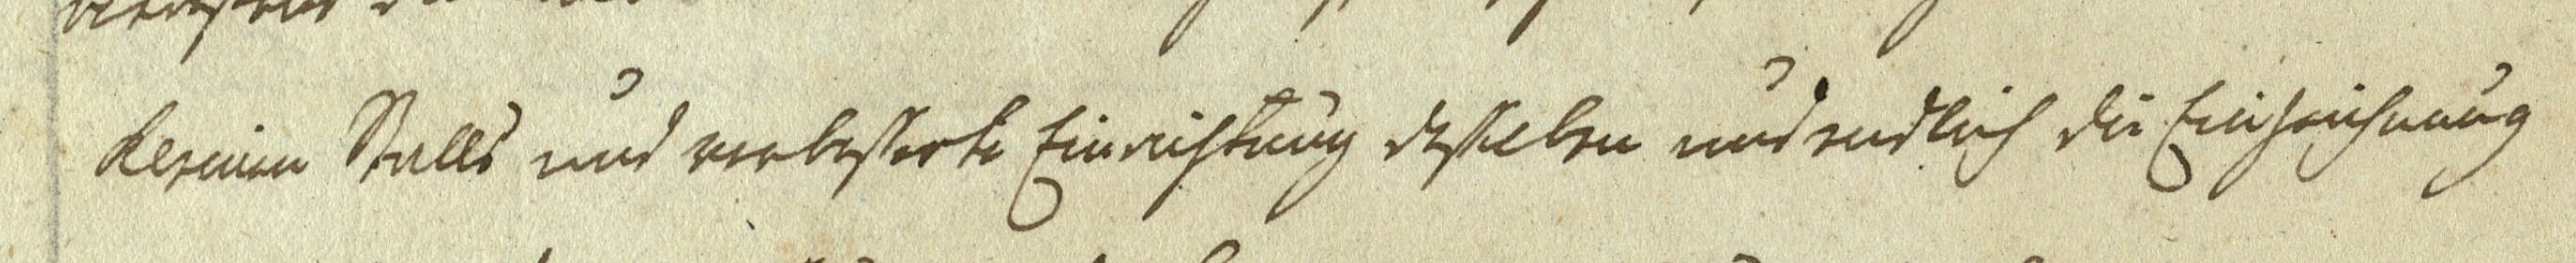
kleinen Stalls und verbesserte Einrichtung desselben und endlich die Einzeichnung
